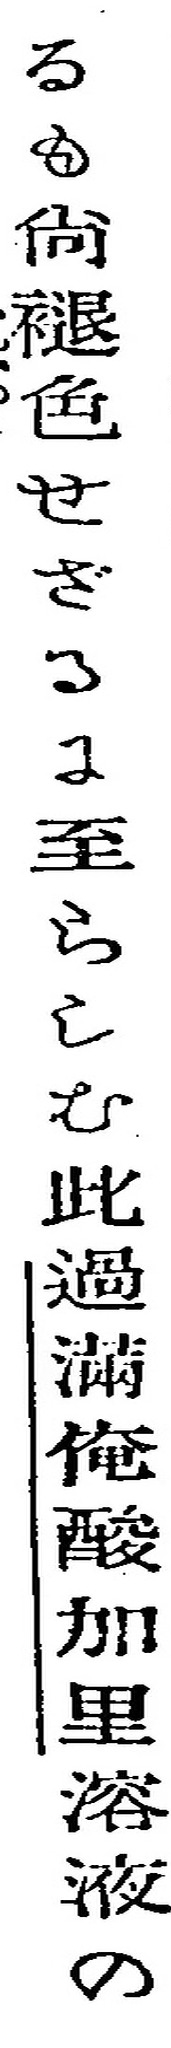るも尚褪色せざるに至らしむ此過滿俺酸加里溶液の
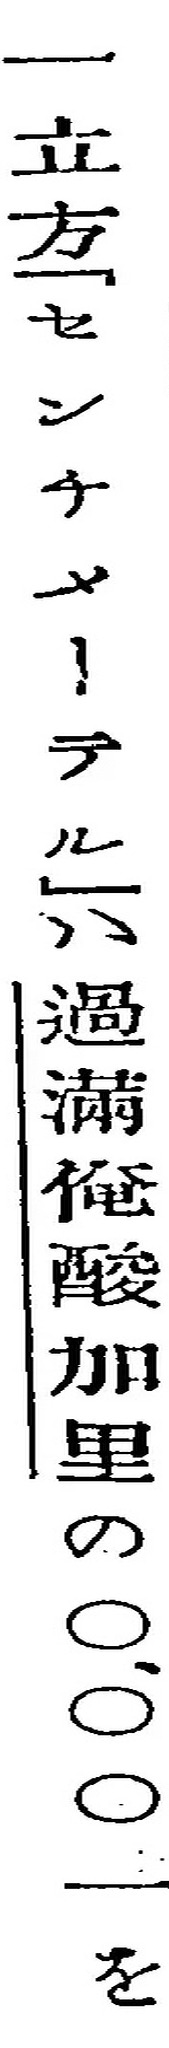一立方[センチメーテル]は過滿俺酸加里の〇、〇〇一を
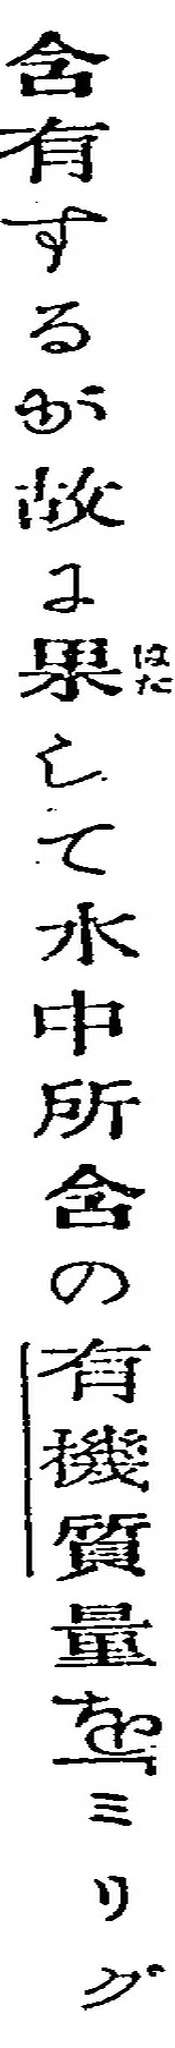含有するが故に果して水中所含の有機質量を[ミリグ
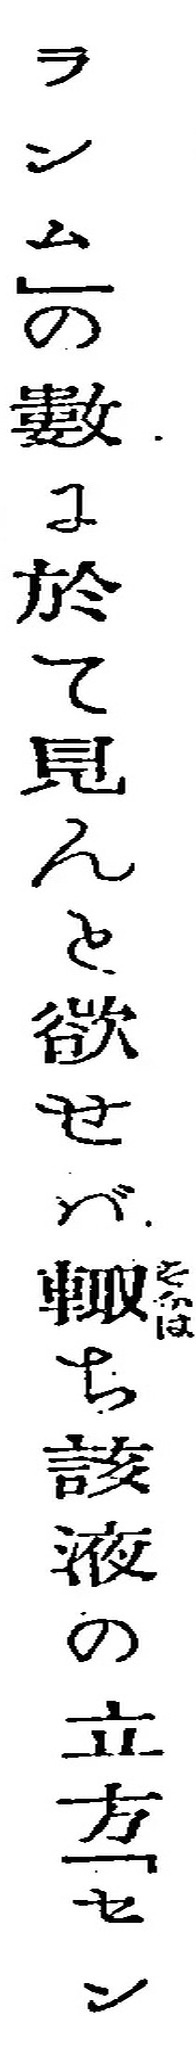ランム]の数に於て見んと欲せば輙ち該液の立方[セン
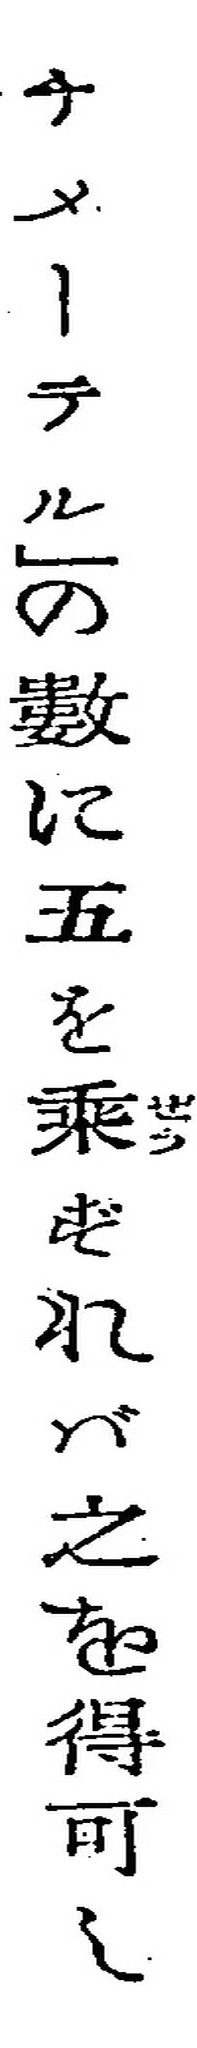チメーテル]の数に五を乗ずれば之を得可し
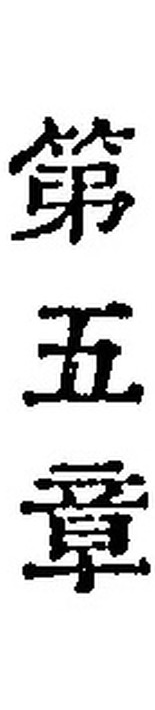第五章

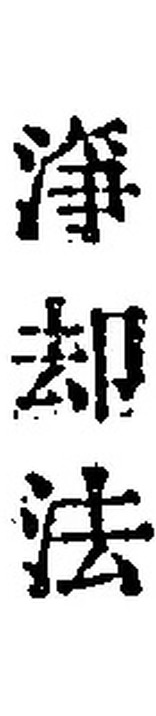浄水法
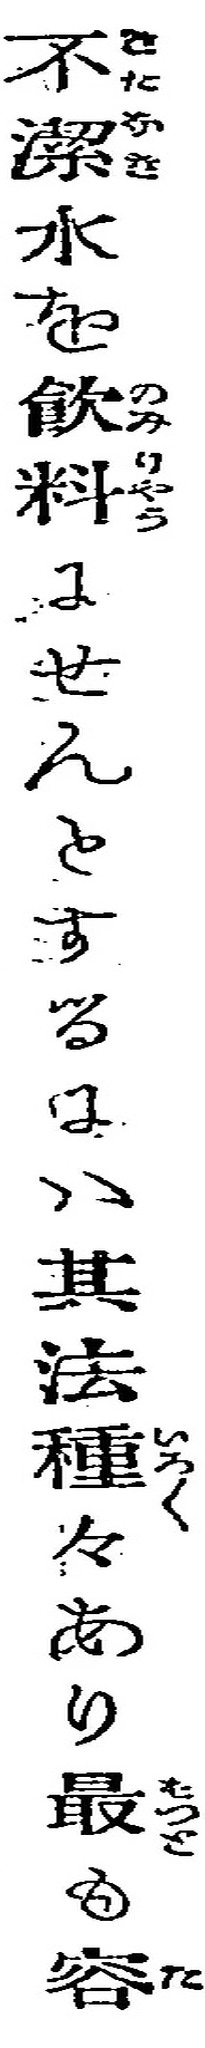不潔みずを飲料にせんとするは其法種々あり最も容
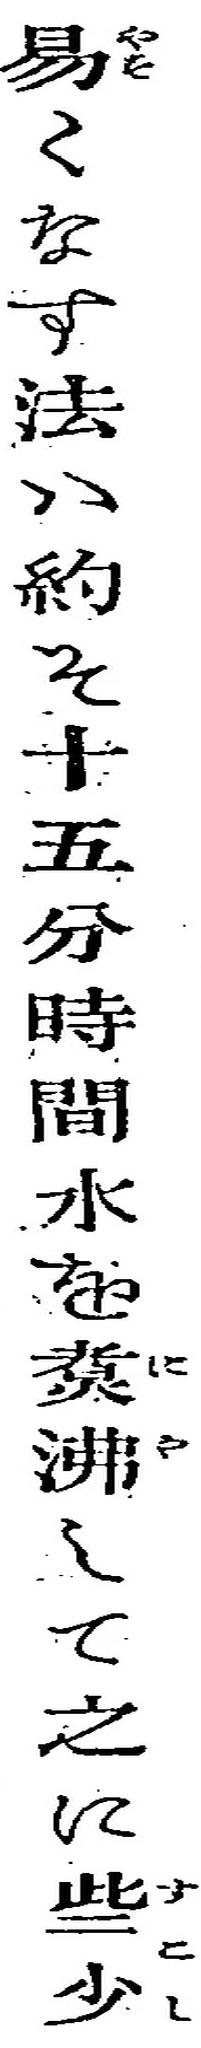易くなす法は約そ十五分時間水を煑沸して之に些少
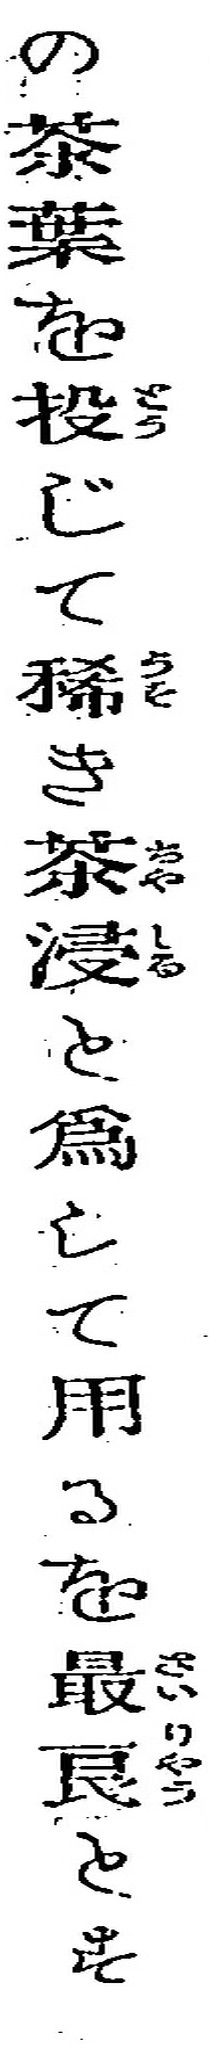の茶葉を投じて稀き茶浸と為して用るを最良とす
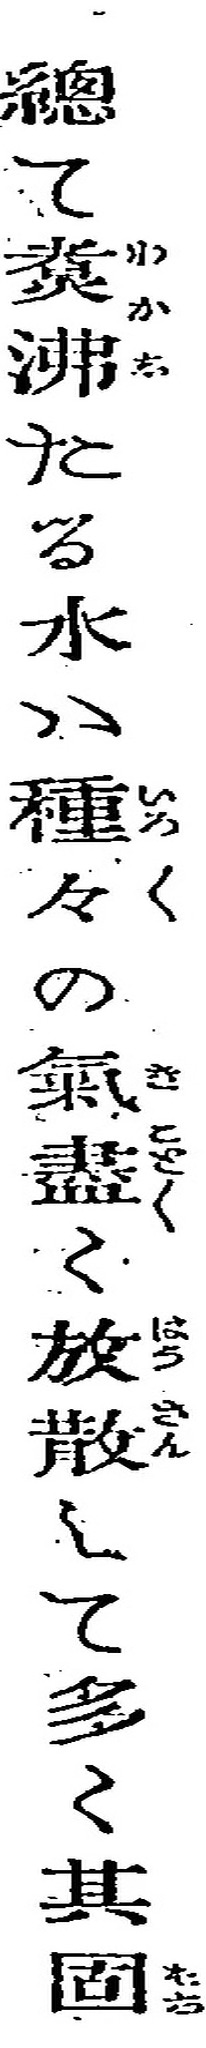総て煑沸たる水は種々の氣盡く放散して多く其固
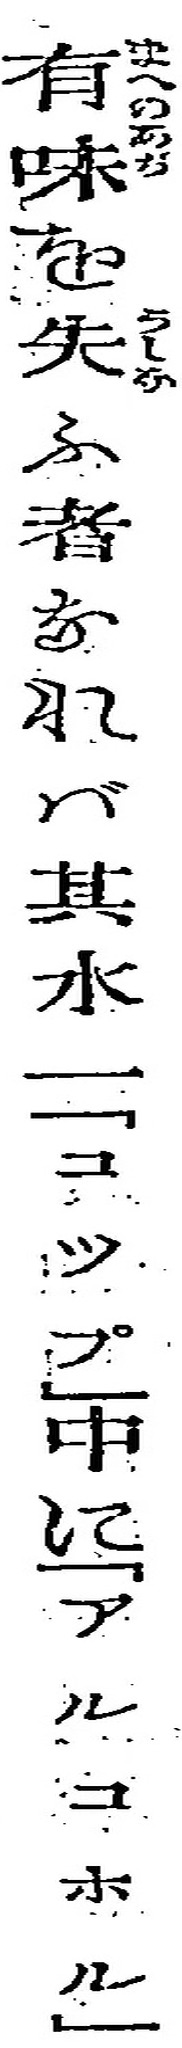有味を失ふ者なれば其水一[コップ]中に[アルコホル]
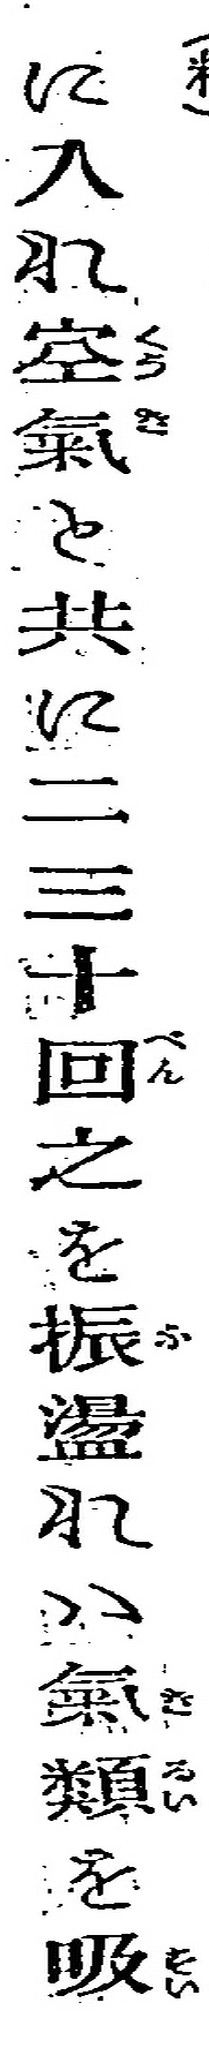に入れて空気を共に二三十回之を振盪れは氣類を吸
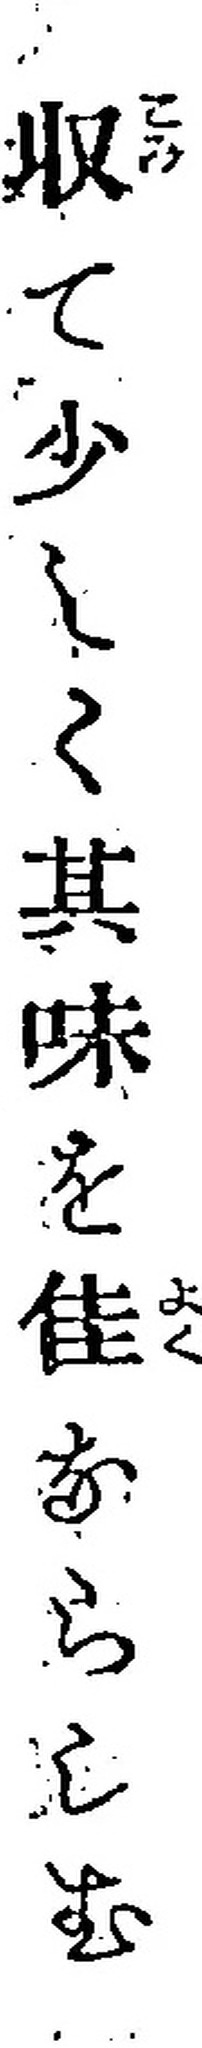収て少しく其味を佳ならしむ
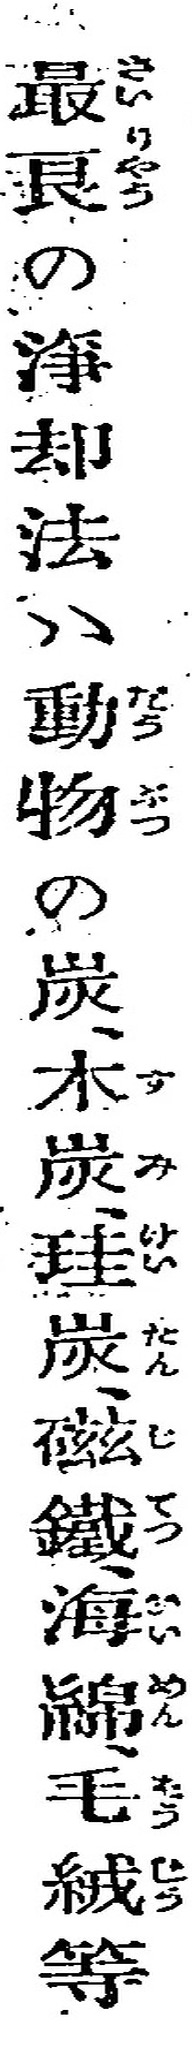最良の浄却法は動物の炭、木炭、珪炭、磁鐵、海綿、毛絨等
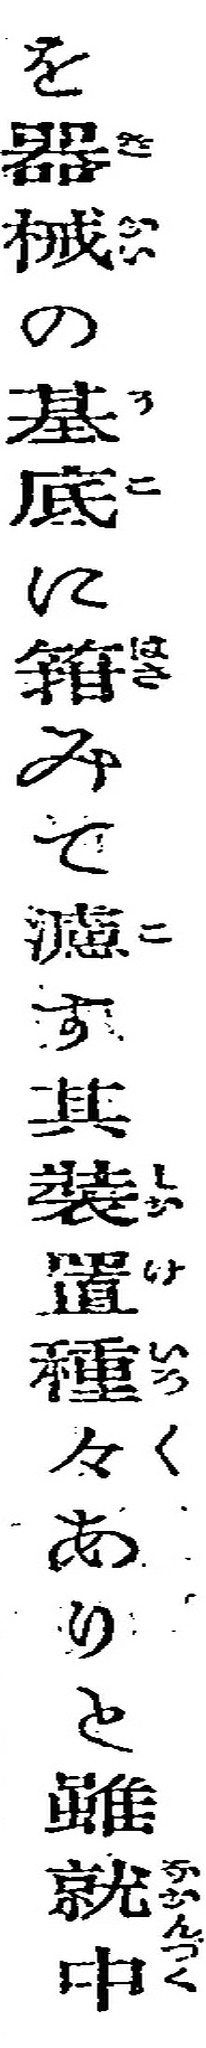を器械の基底に箝みて濾す其装置種々ありと雖就中
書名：飲水の心得 : 伝染病の予防
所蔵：国立国会図書館 National Diet Library, JAPAN
